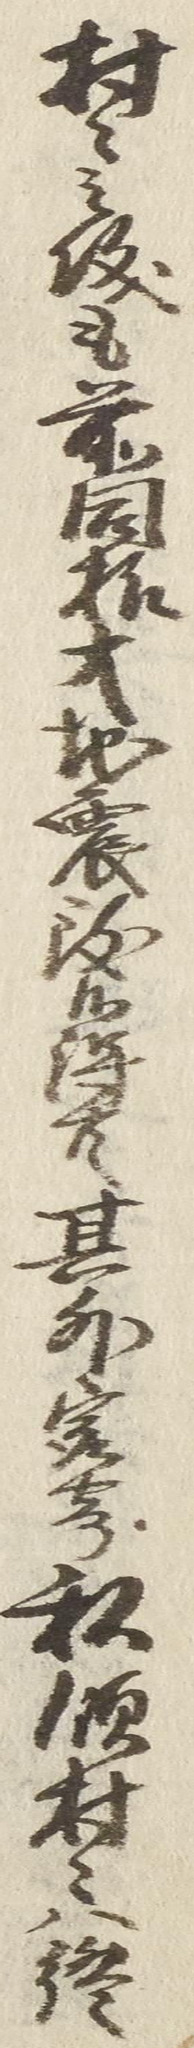村々之儀も前同様共地震致候得共其外最寄私領村々は纔
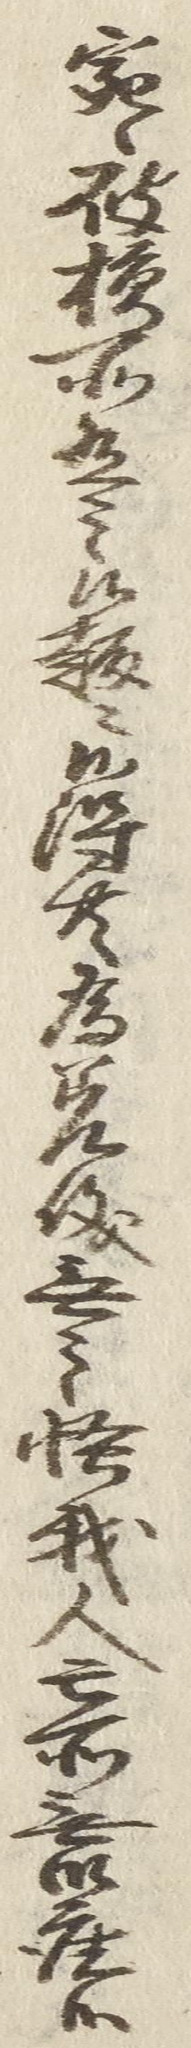宛之破損所々有之候趣二候得共為差儀無之怪我人亡所無御座候
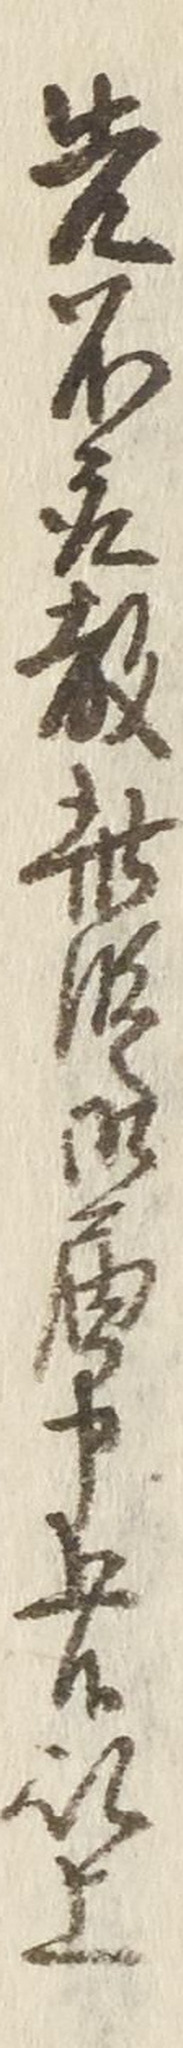先不取敢此段御届申上候以上
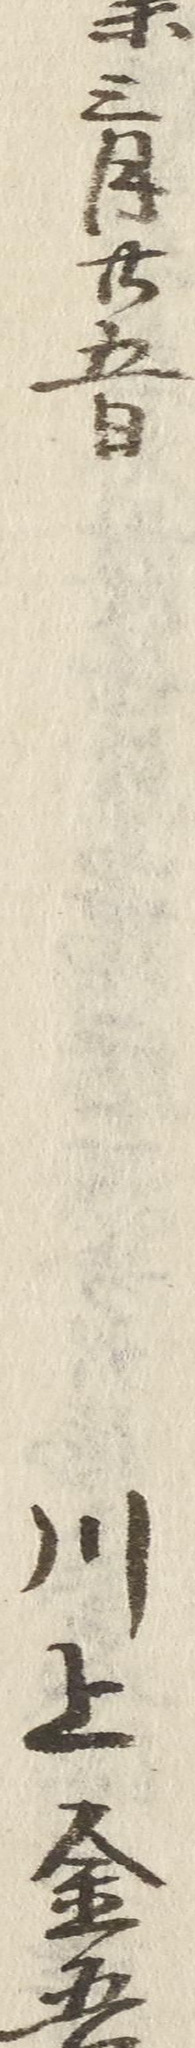未三月廿五日川上金吾
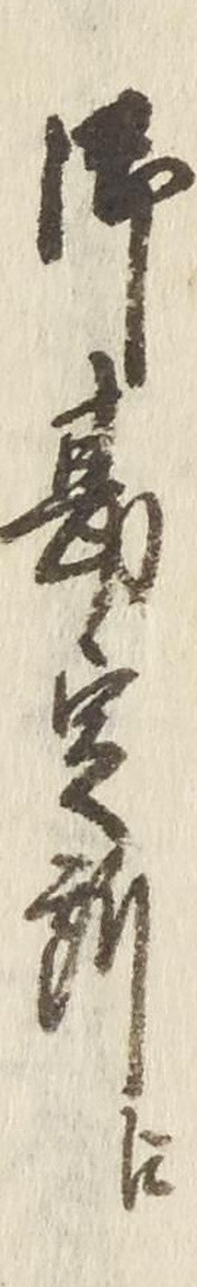御勘定所江
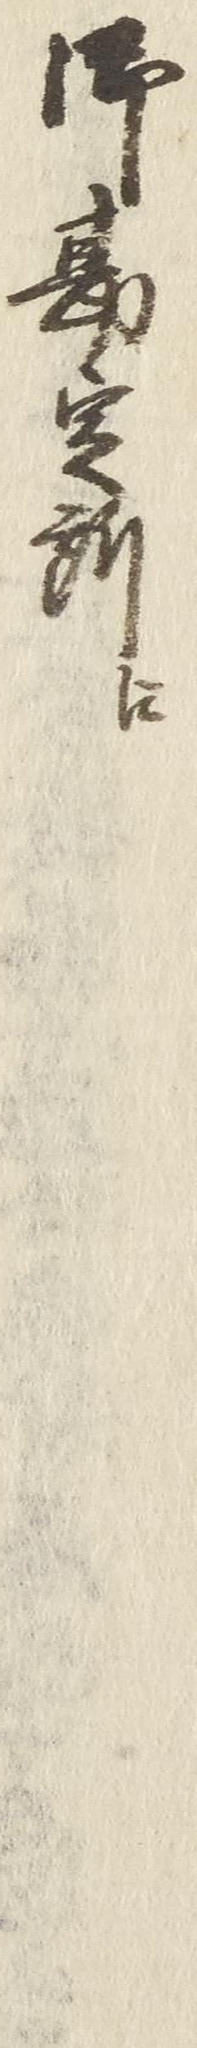御勘定所江
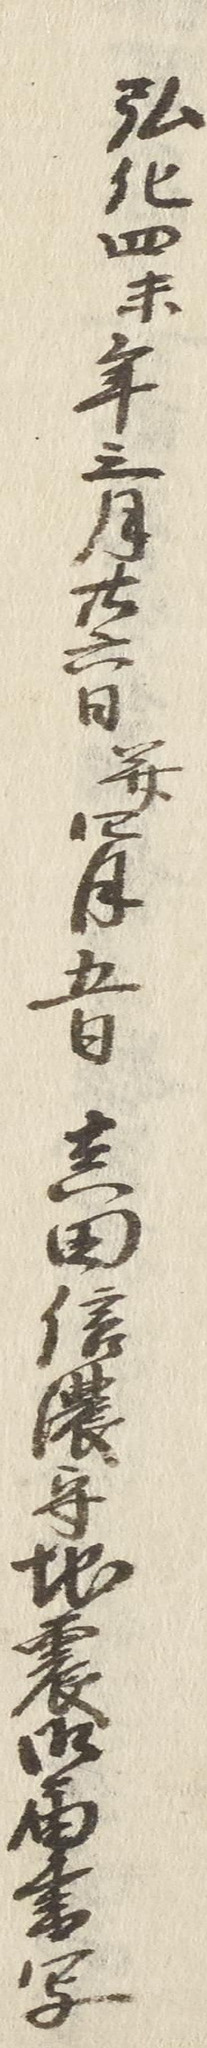弘化四未年三月廿六日并四月五日真田信濃守地震御届書写
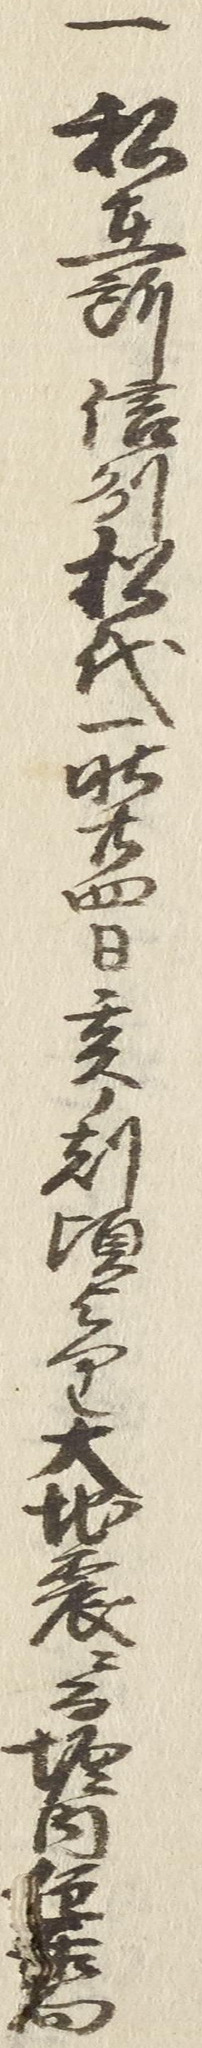一私在所信州松代一昨廿四日亥ノ刻頃より大地震二而城内住居向
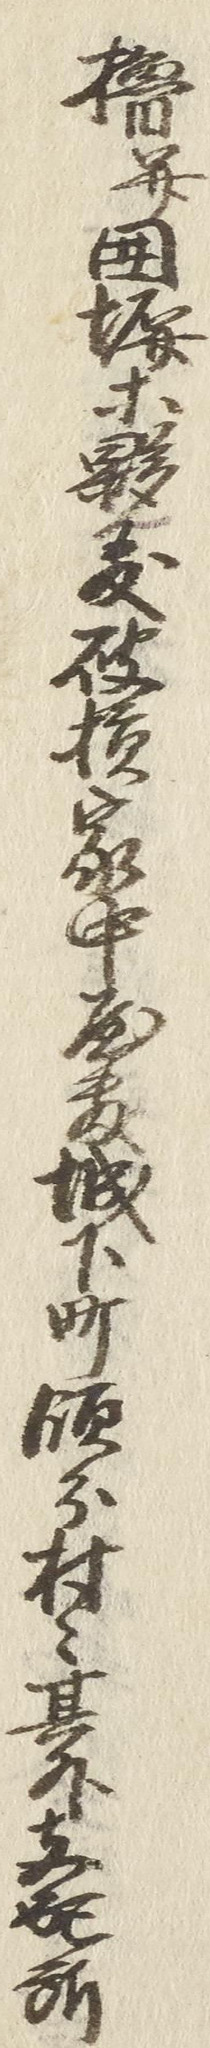櫓并囲塀等夥敷破損家中屋敷城下町領分村々其外支配所
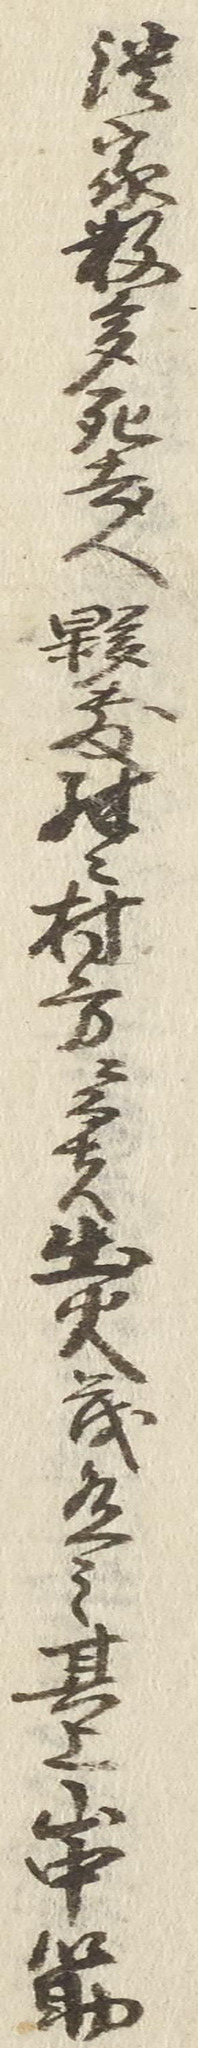潰家数多死去人夥敷村方二而は出火も有之其上山中筋
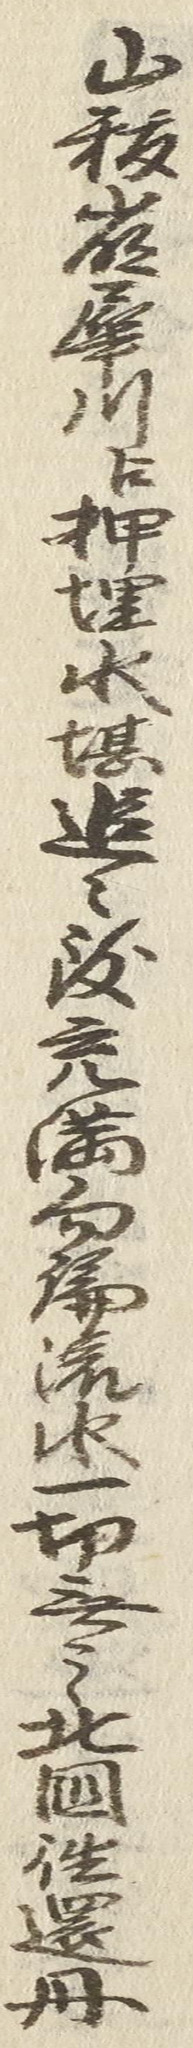山抜崩れ犀川江押出水湛追々致充満勿論流水一向無之北国往還
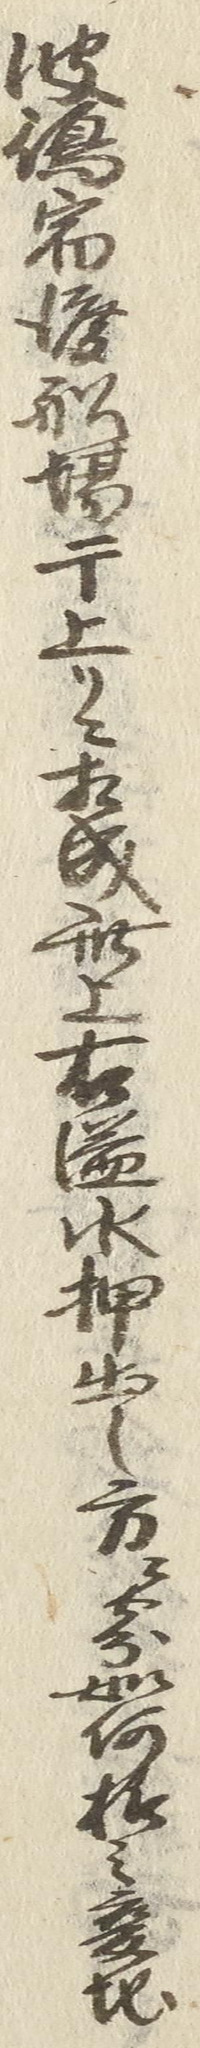丹波嶋宿渡船場干上り二相成此上右溢水押出し方二寄如何様之変地
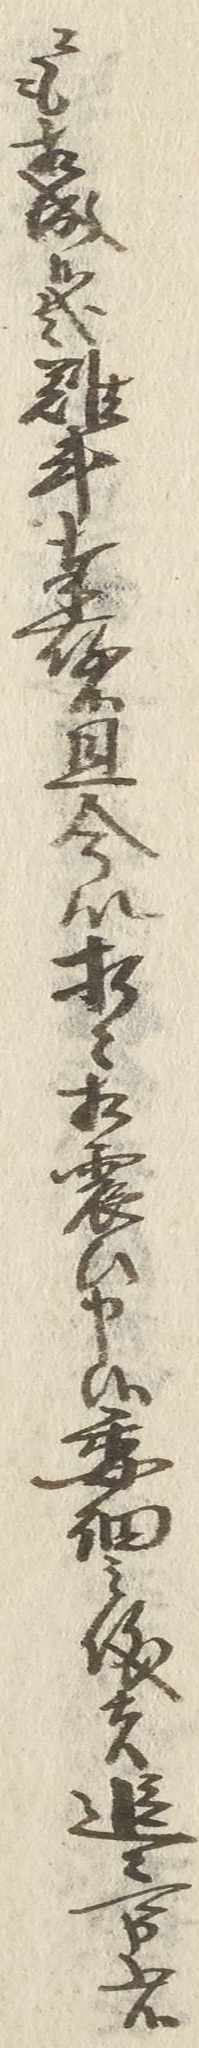二も相成候哉難斗奉存候且今以折々相震ひ申候委細之儀ハ追々可申上候
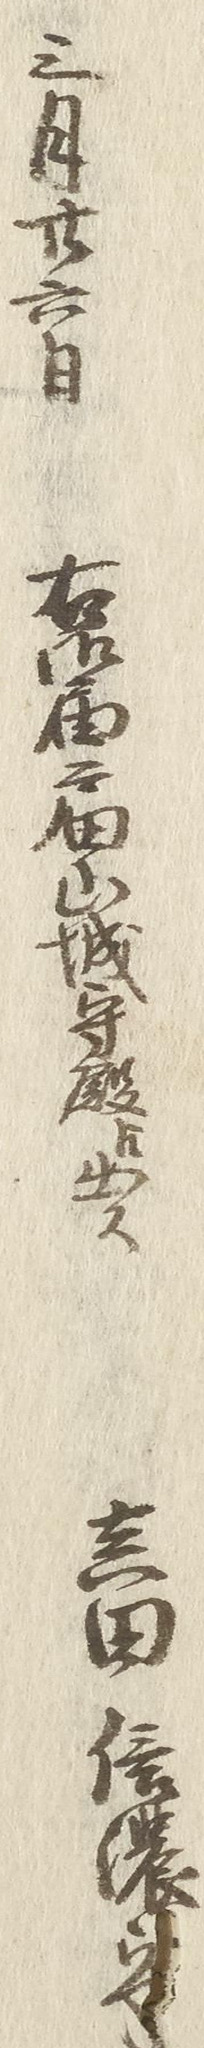三月廿六日右御届戸田山城守殿江出ス真田信濃守
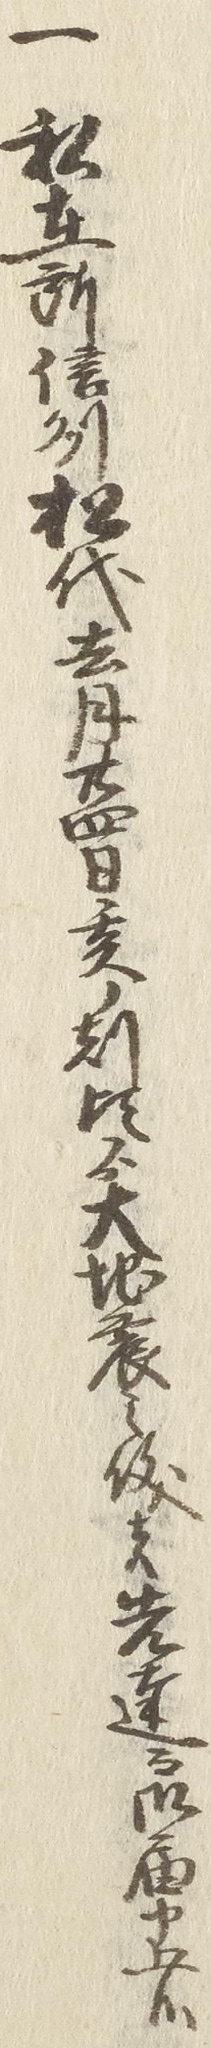一私在所信州松代去月廿四日亥ノ刻ゟ大地震之儀は先達而先御届申上候
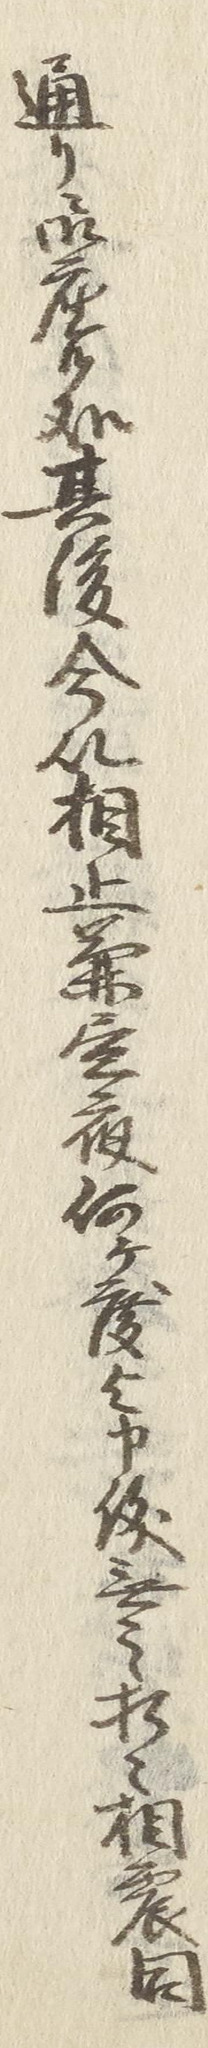通りに御座候処其後今以相止兼昼夜何ヶ度と申儀無之折々相震同
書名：従往古地震御届書記誌之一
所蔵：東京大学地震研究所図書室 Earthquake Research Institute Library, The University of Tokyo, JAPAN
